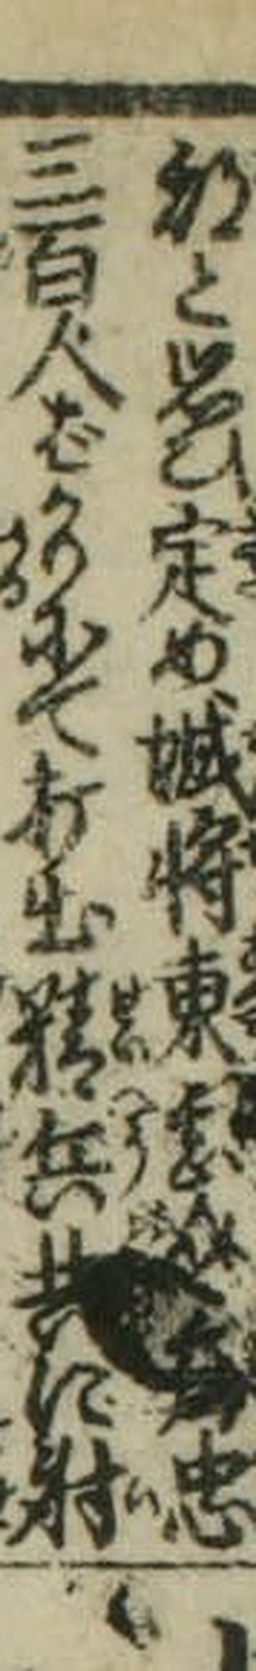三百人ばかりにて打出精兵共に射
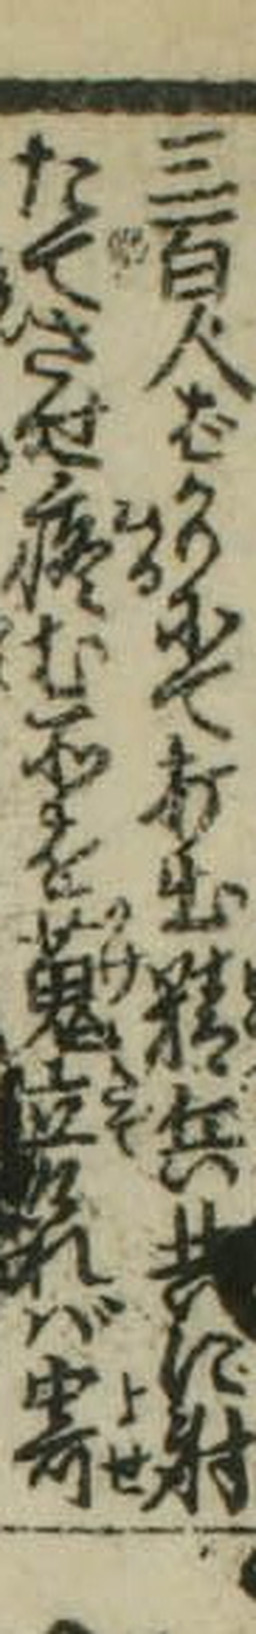たてさせ疼む所を蒐立ければ寄
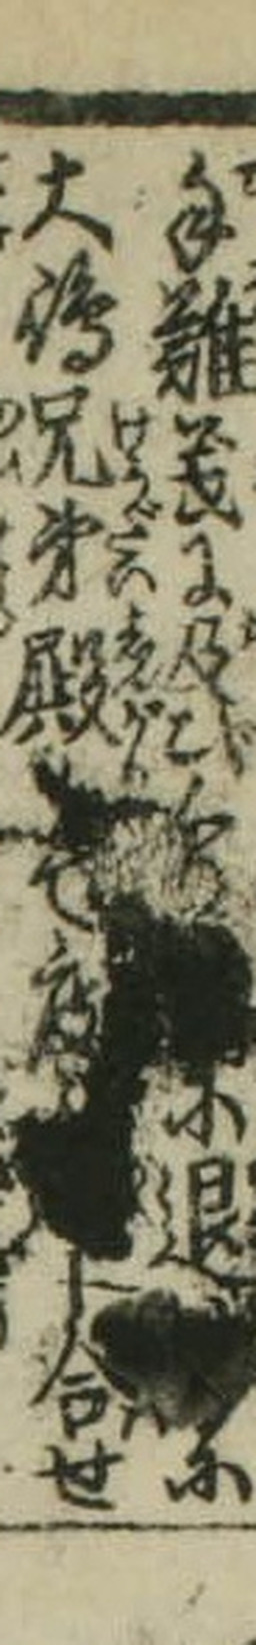大嶋兄弟殿て度々し合せ
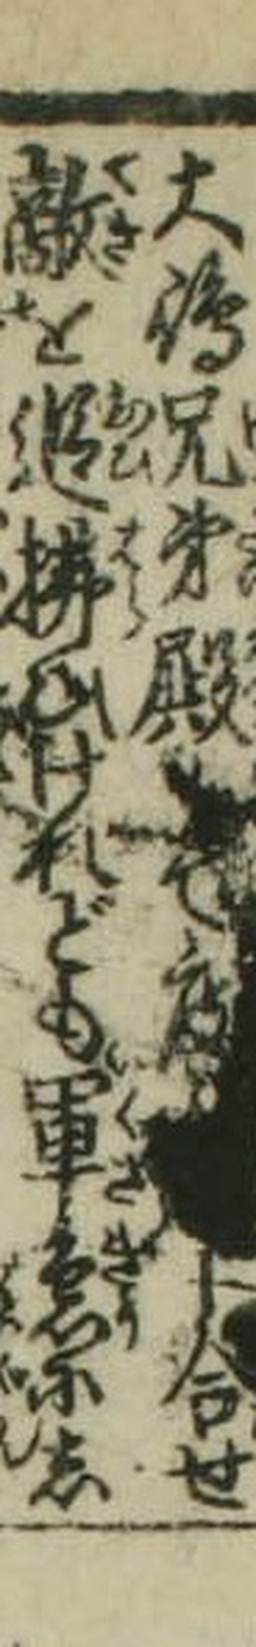敵を追拂ひけれども軍急にし
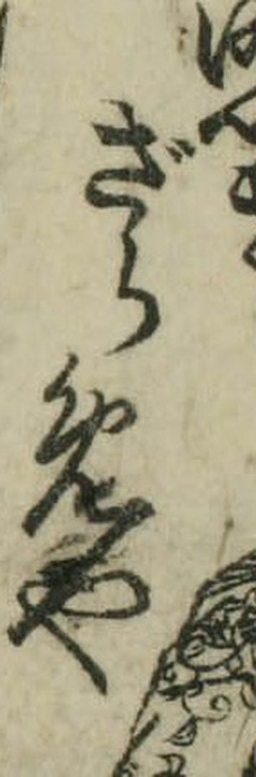ざらめや
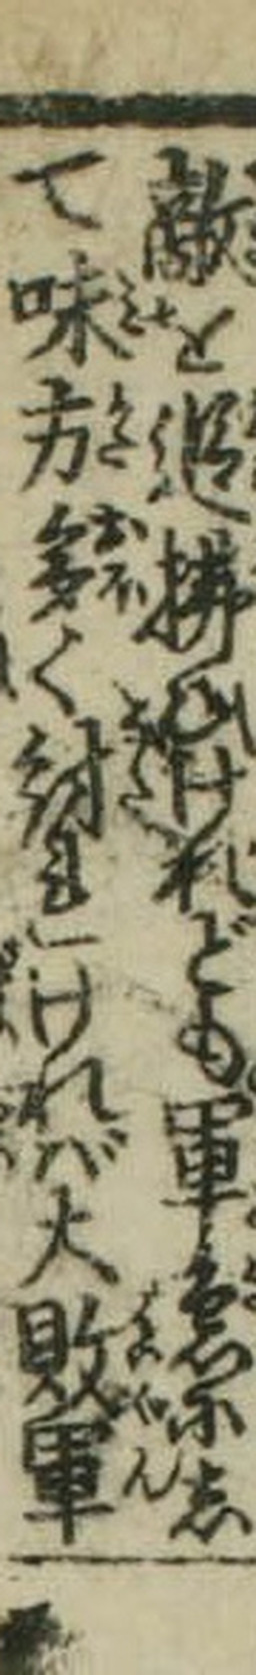て味方多く討れければ大敗軍
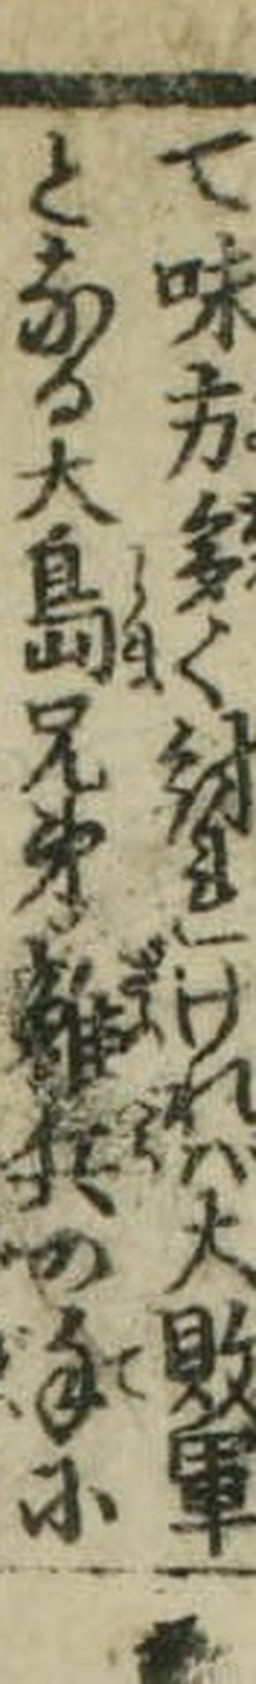となる大島兄弟雑兵の手に
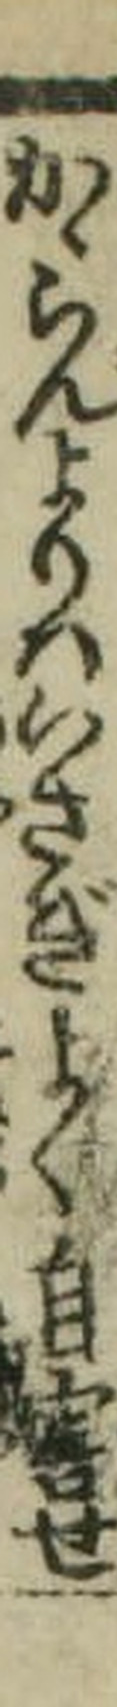かゝらんよりはいさぎよく自害せ
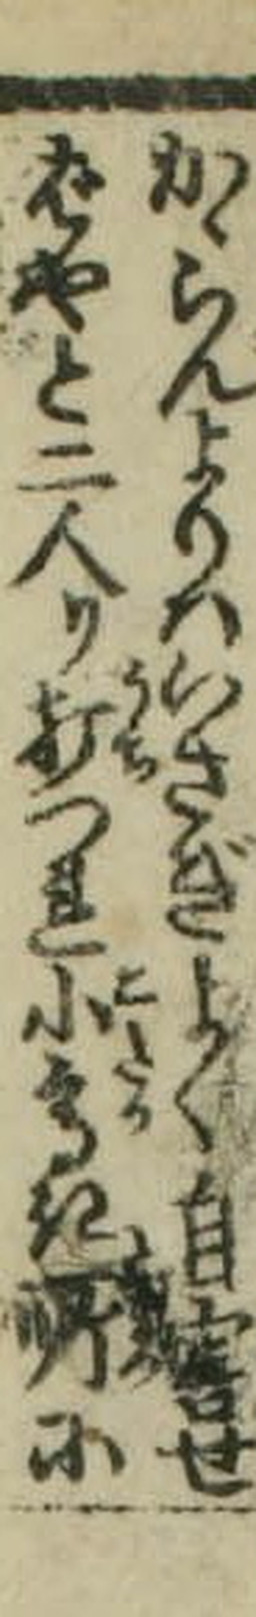ばやと二人り打つれ小高き所に
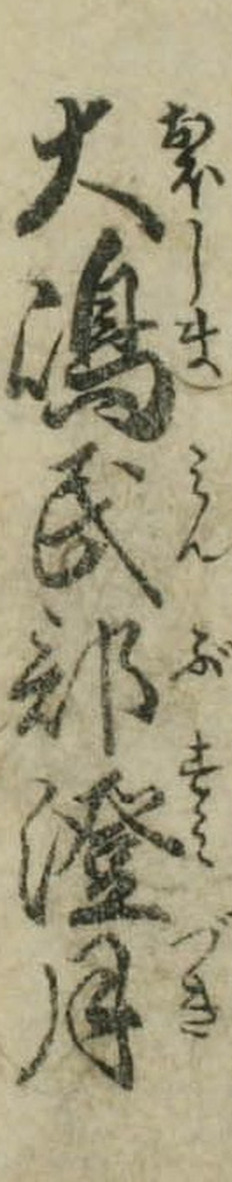大嶋民部澄月
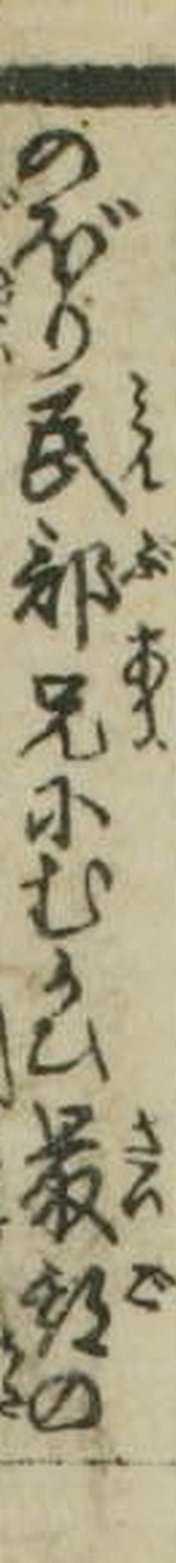のぼり民部兄にむかひ最期の
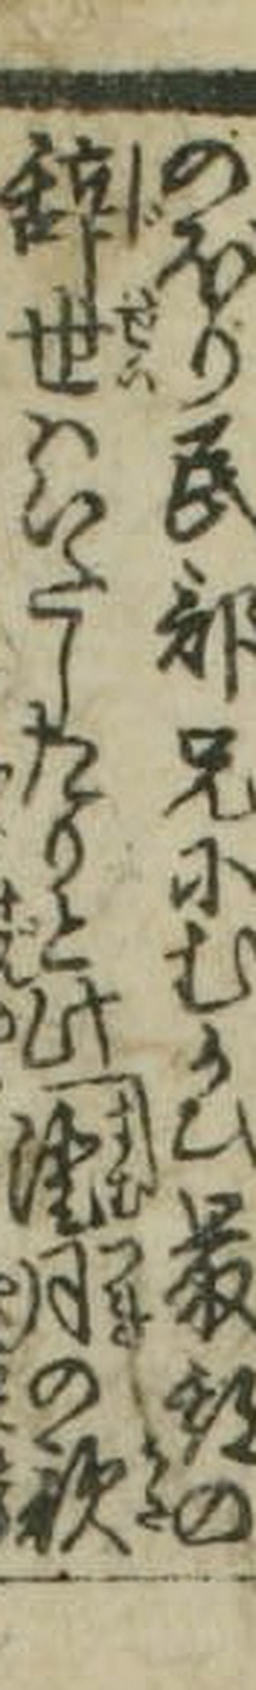辞世はいたしたりと此〽澄月の歌
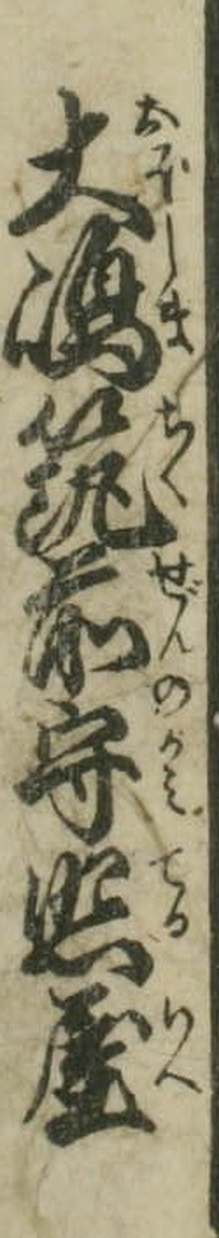大嶋筑前守照屋
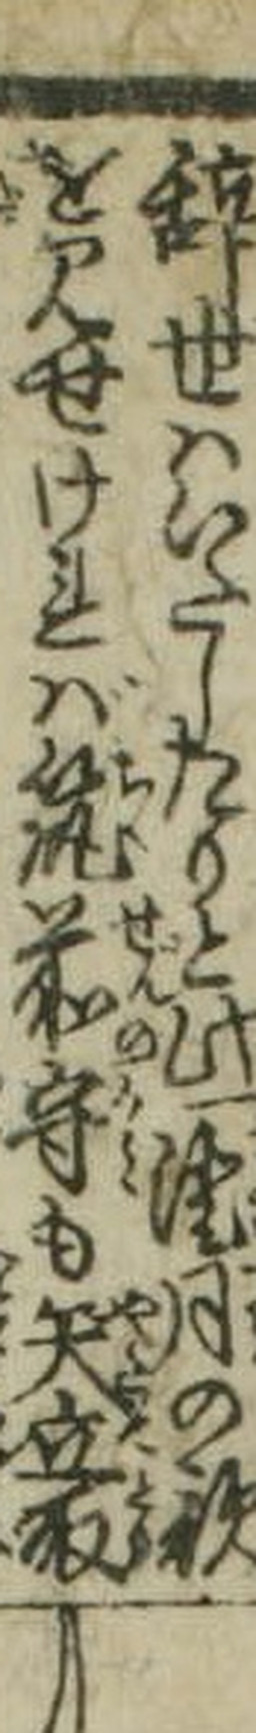を見せければ筑前守も矢立取
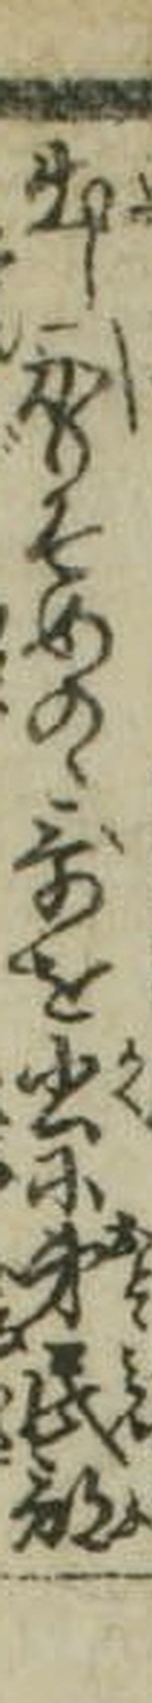出し〽かりそめのゝ歌を書に弟民部
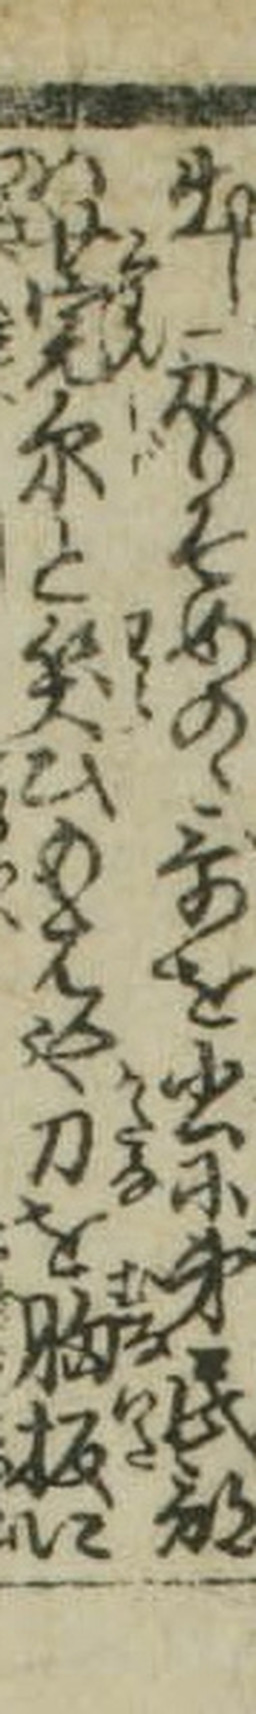は莞爾と笑ひもはや刀を胸板に
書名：續英雄百人一首
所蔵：東京学芸大学附属図書館
